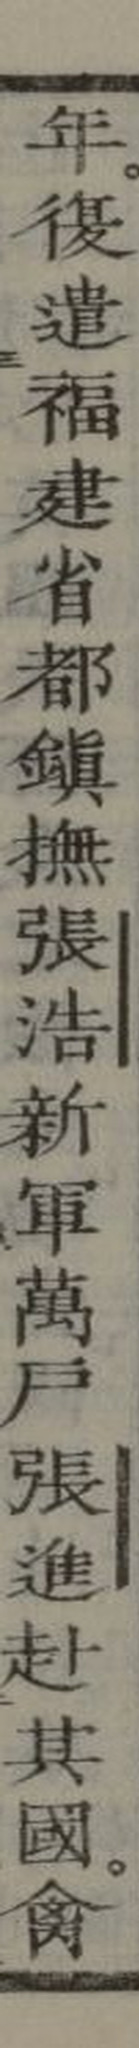年。復遣福建省都鎭撫張浩新軍萬戸張進赴其國。禽
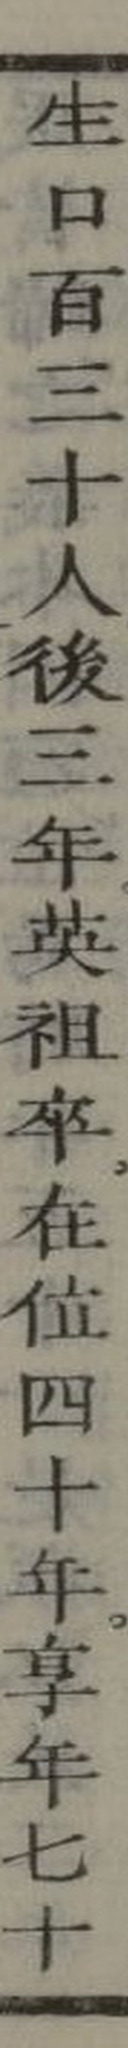生口百三十人。後三年。英祖卒。在位四十年。享年七十

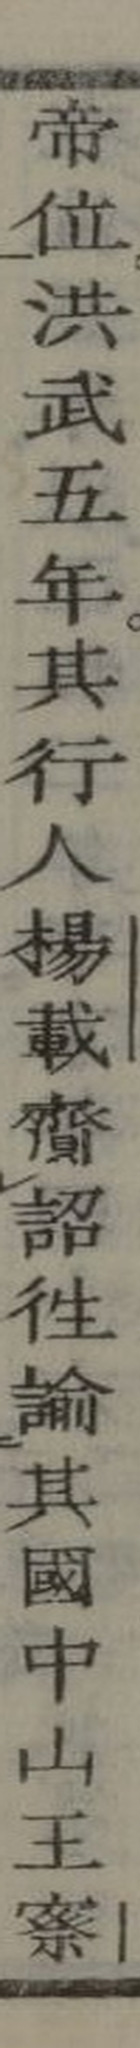帝位。洪武五年。其行人楊載齎詔徃諭其國中山王察
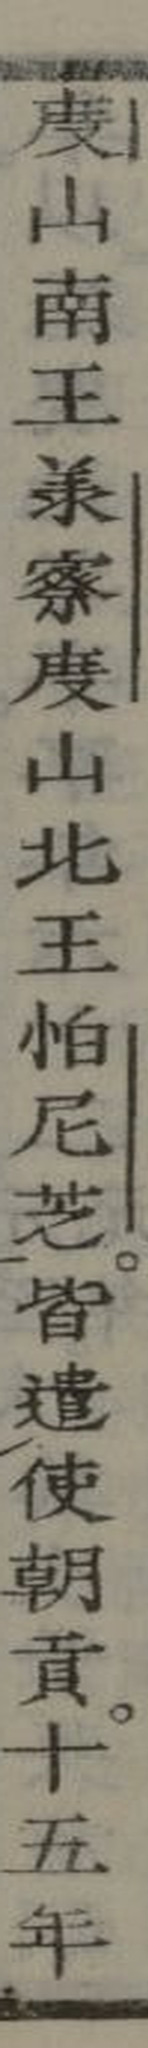度山南王羕察度山北王怕尼芝。皆遣使朝貢。十五年
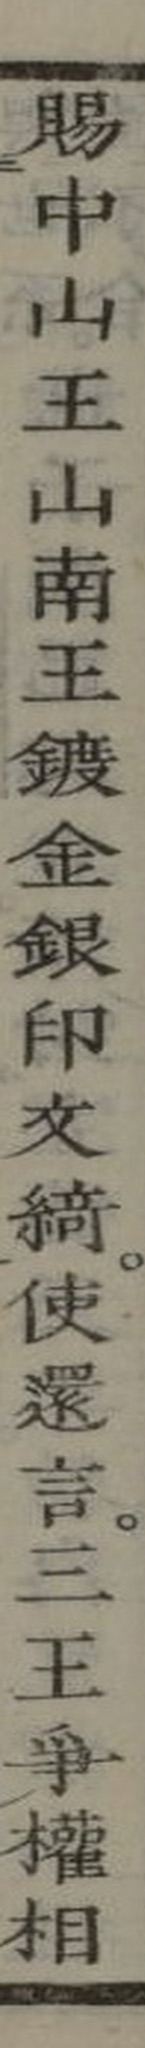賜中山王山南王鍍金銀印文綺。使還言。三王爭權相
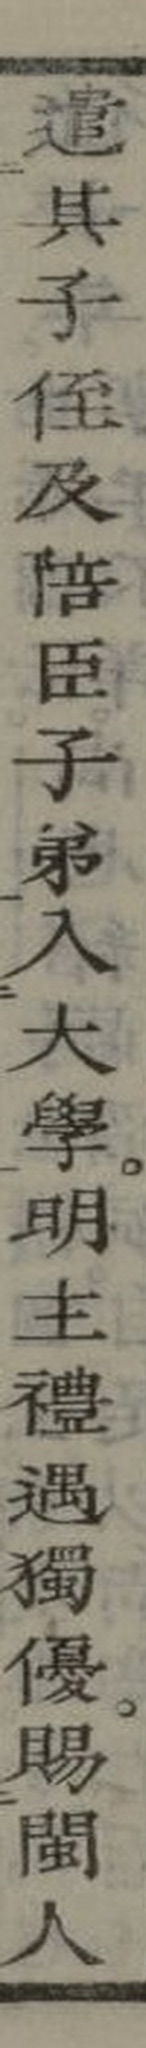遣其子侄及陪臣子弟入大學。明主禮遇獨優。賜閩人
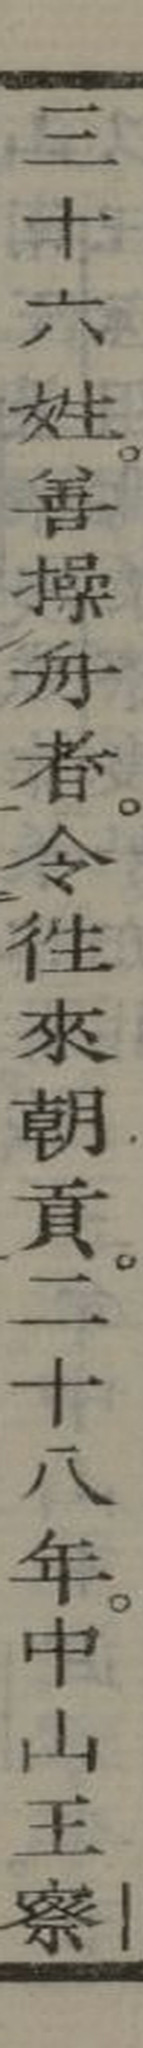三十六姓。善操舟者。令徃來朝貢。二十八年。中山王察

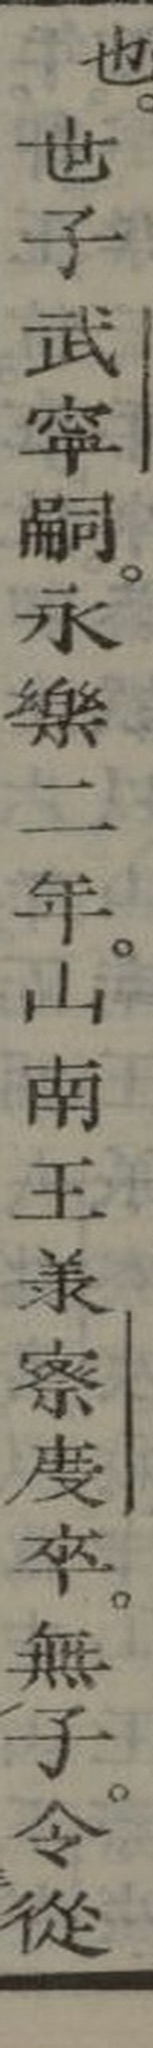也。世子武寧嗣。永樂二年。山南王羕察度卒。無子。令從

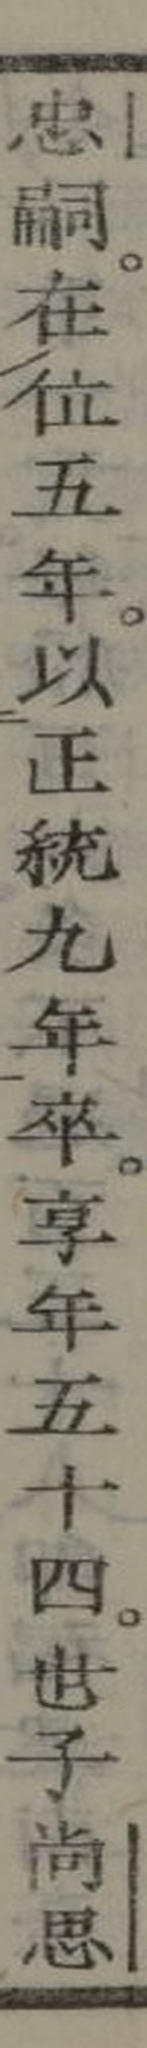忠嗣。在位五年。以正統九年卒。享年五十四。世子尚思
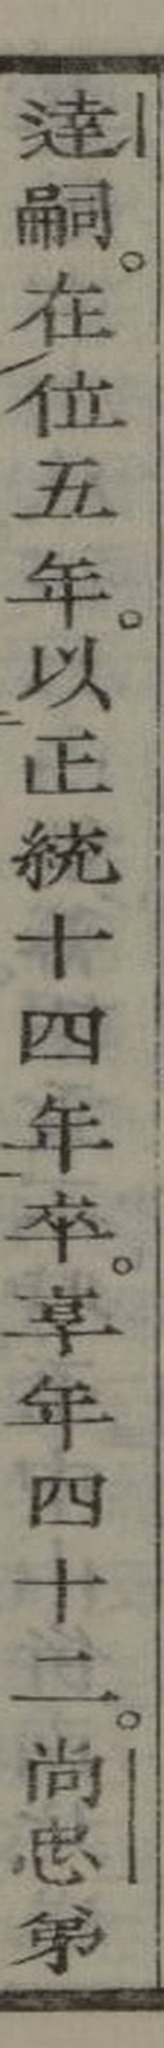逹嗣。在位五年。以正統十四年卒。享年四十二。尚忠弟
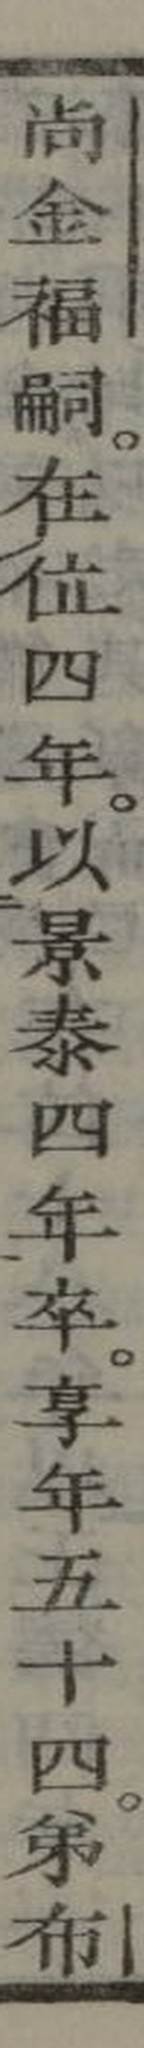尚金福嗣。在位四年。以景泰四年卒。享年五十四。弟布
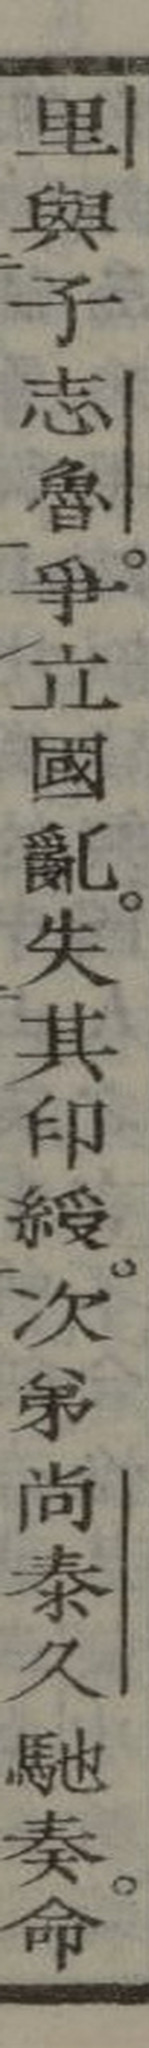里與子志魯。爭立國亂。失其印綬。次弟尚泰久馳奏。命
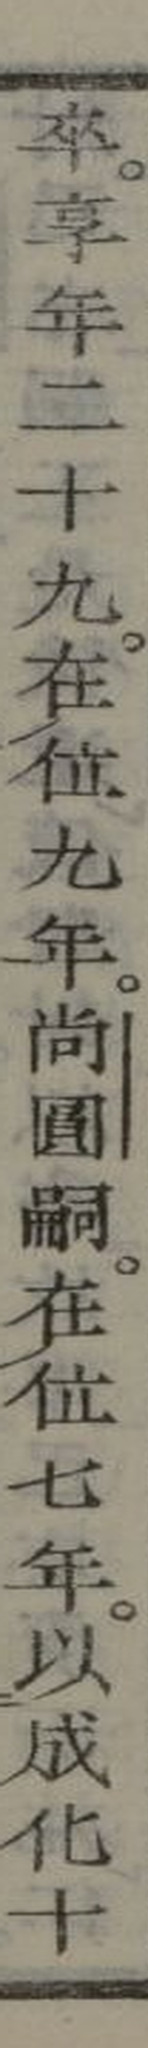卒。享年二十九。在位九年。尚圓嗣。在位七年。以成化十
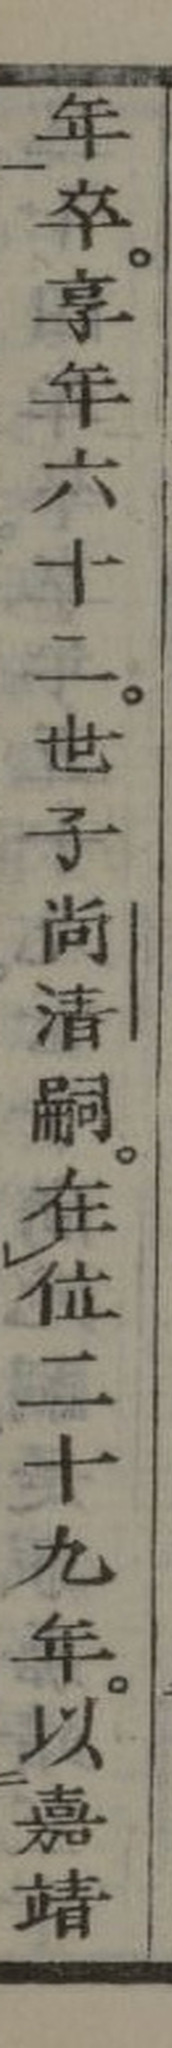年卒。享年六十二。世子尚清嗣。在位二十九年。以嘉靖

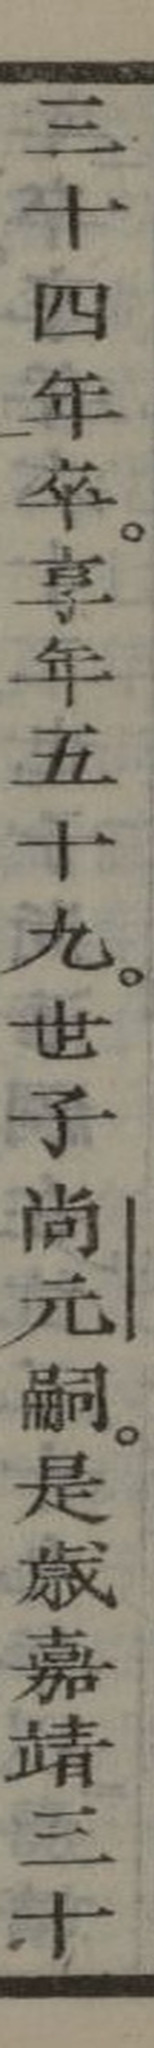三十四年卒。享年五十九。世子尚元嗣。是歳嘉靖三十
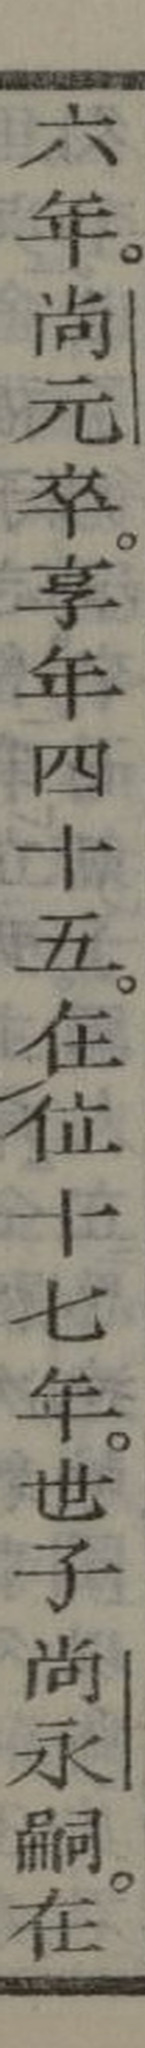六年。尚元卒。享年四十五。在位十七年。世子尚永嗣。在
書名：南島志 呂
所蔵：University of the Ryukyus Library
